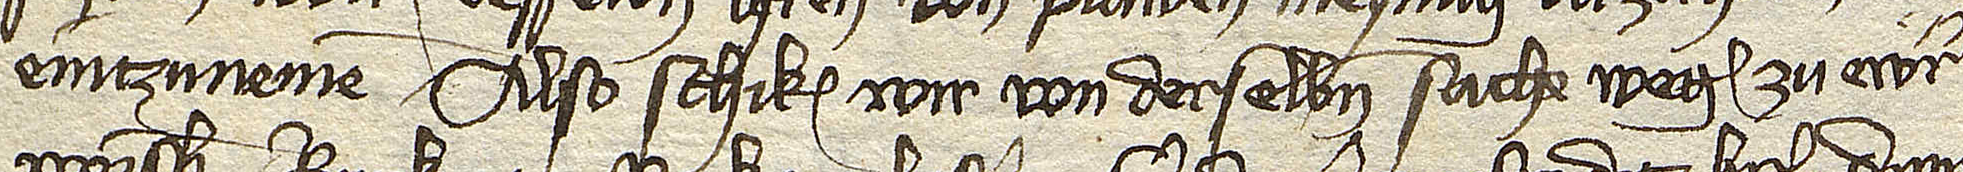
eincʒuneme* / Alſo ſchik* wir von derſelbn* ſache weg* ʒu eẅr*
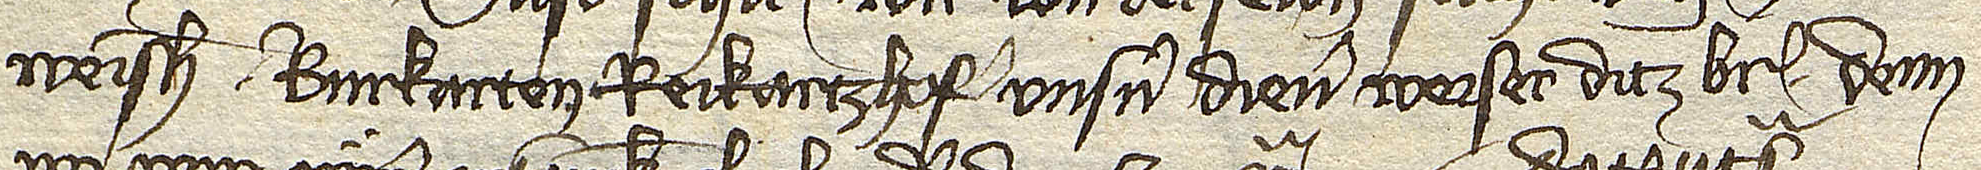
weiſh* Burkarten Reikarcʒhof* vnſn* dien* weiſer dicʒ br* / Denn
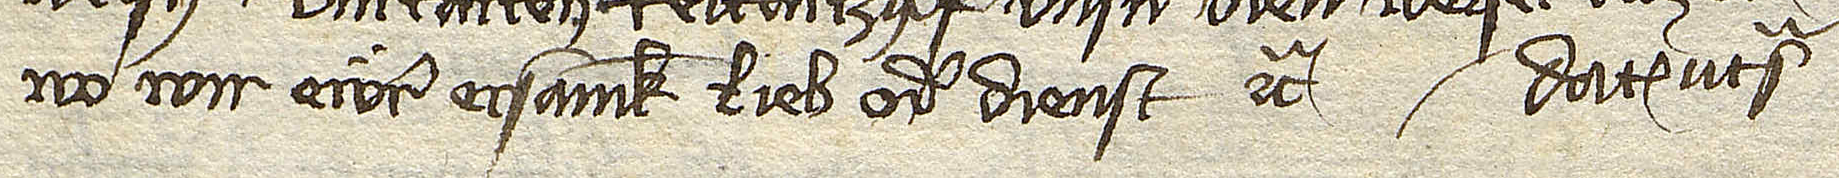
wo wir eẅr* erſamk* lieb od* dienſt ec* / Dat* ut ſ*
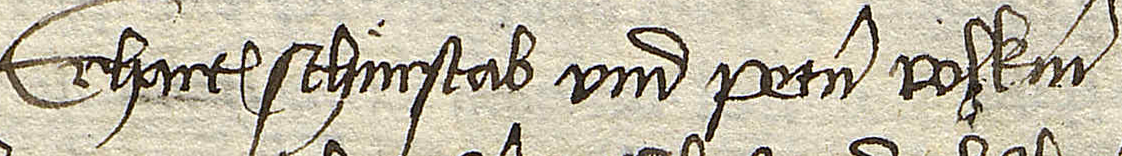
Erhart* ſchürſtab vnd Petn* volkm*
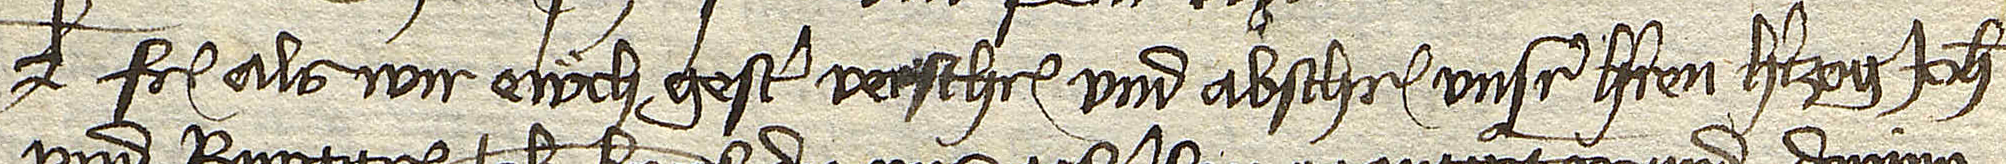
L* fr* als wir eẅch geſt* verſchr* vnd abſchr* vnſr* h*ren h*cʒog Ioh*
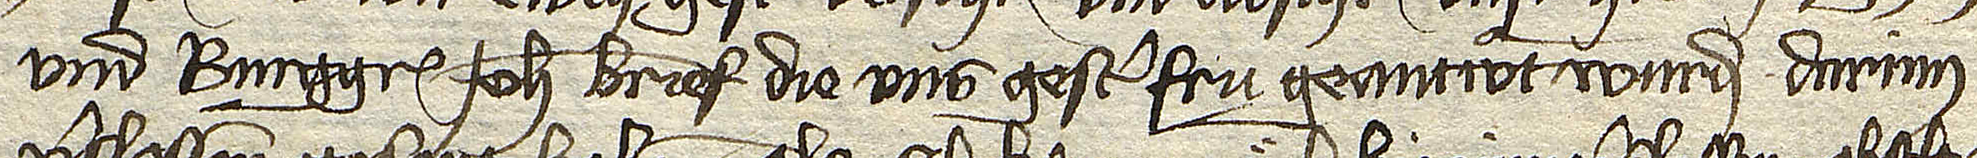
vnd Burggr* Ioh* brief die vns geſt* fru geantw*t wurd* . darinn
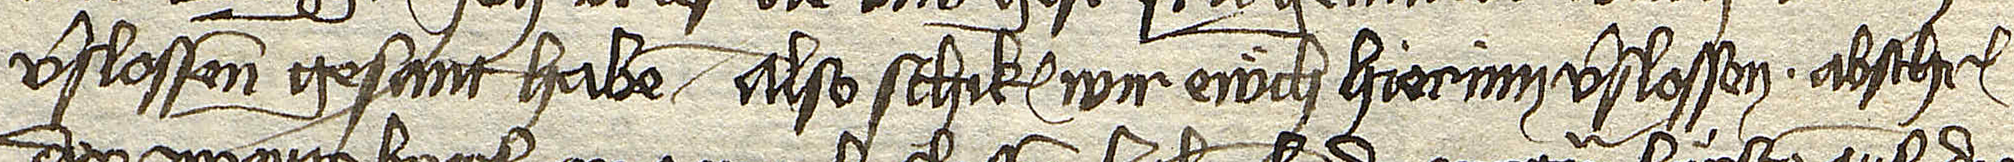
v*ſloſſen geſant habe* / alſo ſchik* wir eẅch hierinn v*ſloſſen . abſchr*
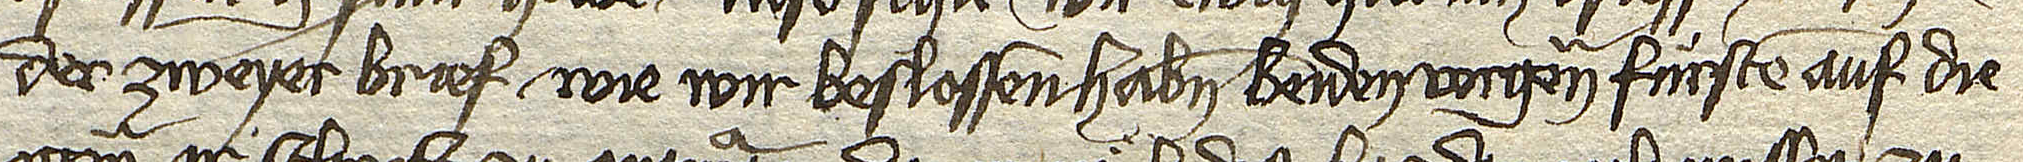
der ʒweyer brief / wie wir beſloſſen habn* beiden vorgen* fürſte* auf die
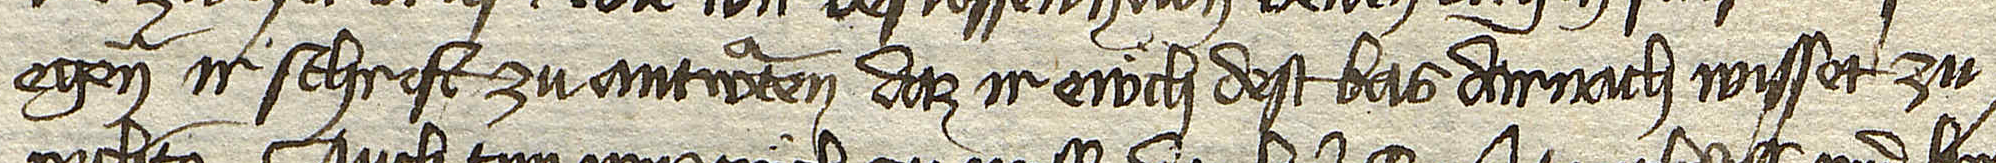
egen* ir ſchrift ʒu antw*ten daʒ ir eẅch deſt bas darnach wiſſet ʒu
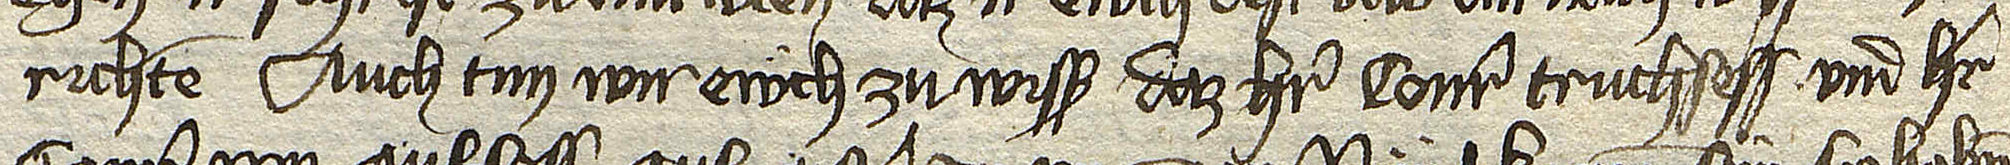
richte* Auch tun wir eẅch ʒu wiſſ* / daʒ hr* Conr* truchſeſſ . vnd hr*
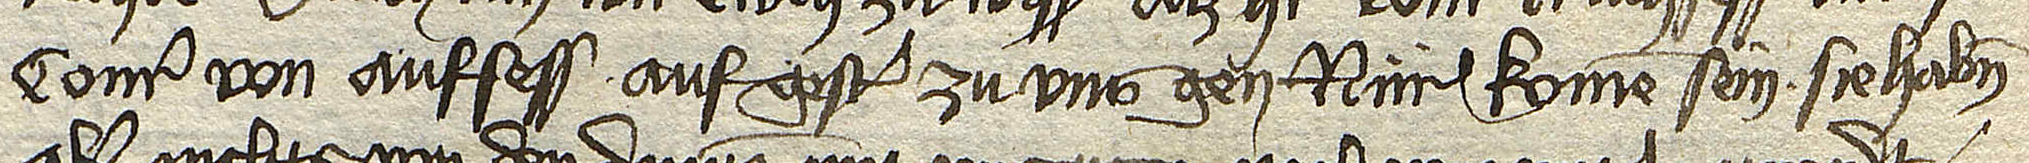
Conr* von aufſeſſ . auf geſt* ʒu vns gen Nür* kome* ſein . ſie habn*
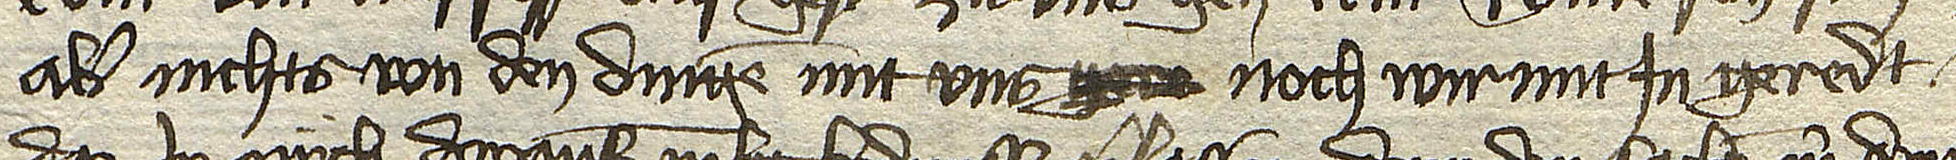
ab* nichts von den dinge* mit vns ger noch wir mit In geredt /
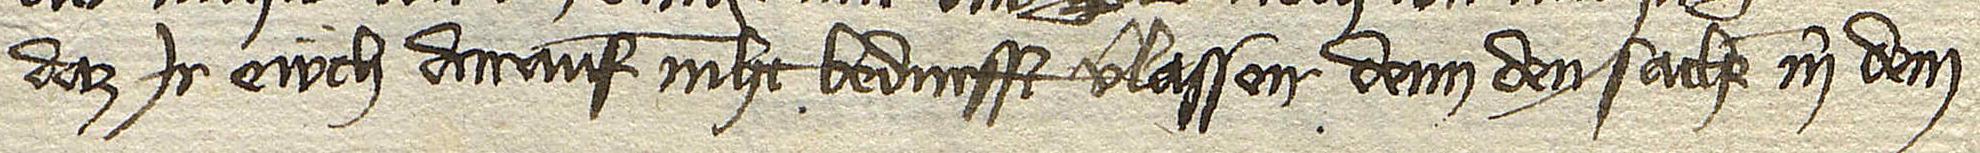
daʒ Ir eẅch darauf niht bedurfft v*laſſen / denn den ſache* in dem
